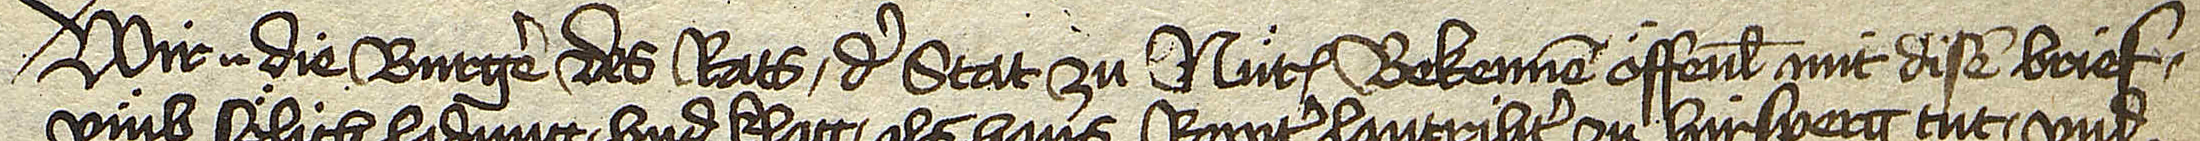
Wir ~ die Burge* des Rats / d* Stat cʒu Nür* Bekenne* öffenl* mit diſe* brief /
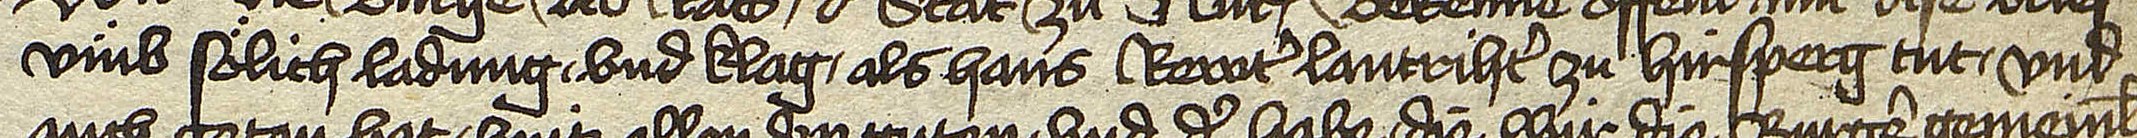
v̈mb ſölich ladung / vnd klag / als hans Rewt* lantricht* cʒu hirſperg tut / vnd
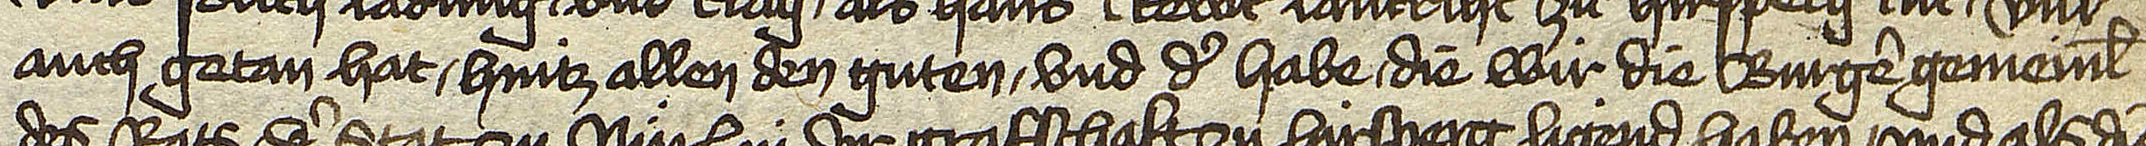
auch getan / hintʒ allen den guten / vnd d* habe / die wir die Burge* gemeinl*
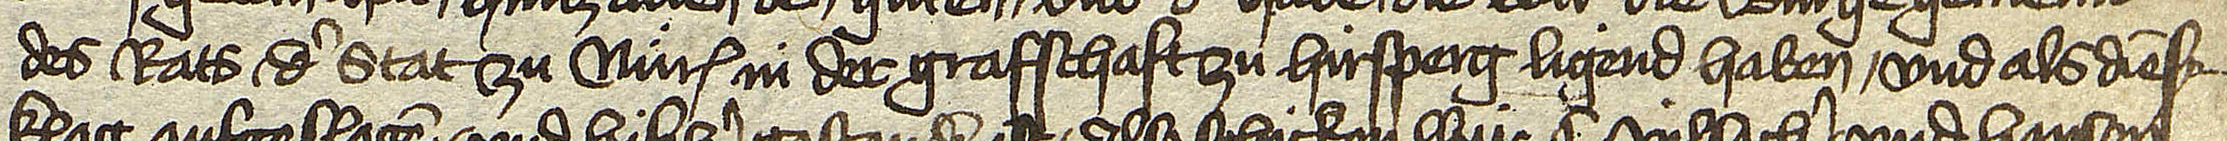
des Rats / d* Stat cʒu Nür* in der grafſchaft cʒu hirſperg ligend haben / vnd als dieſ*
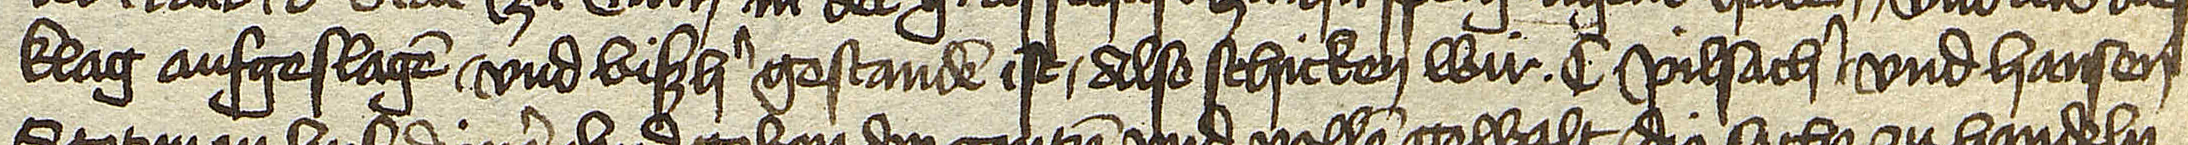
klag aufgeſlage* / vnd biſʒh* geſtande* iſt / Alſo ſchicken wir . C. Pilſach* / vnd hanſen
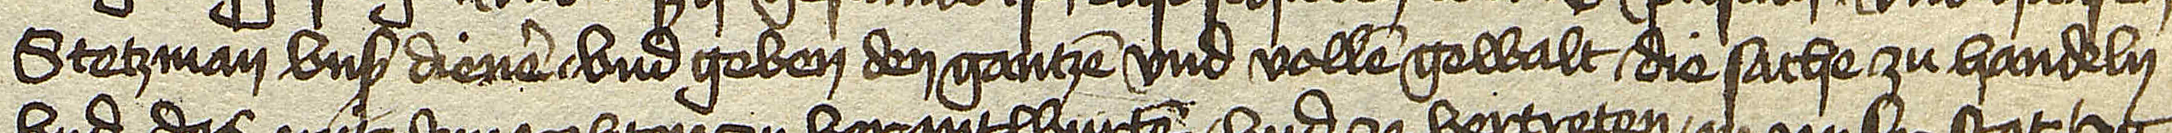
Stetʒman vnſ* diene* / vnd geben den gantʒe* vnd volle* gewalt / die ſache cʒu handeln
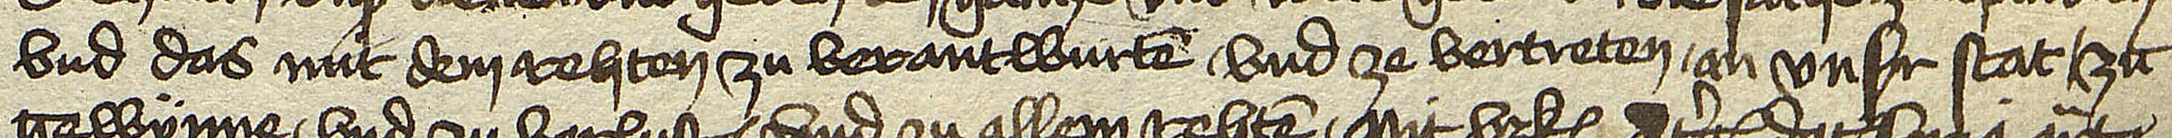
vnd das mit dem rehten cʒu verantwurte* / vnd cʒe vertreten / an vnſ*r ſtat / cʒu
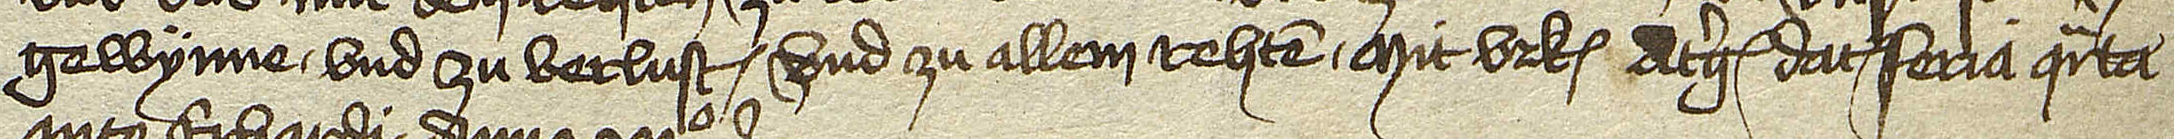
gewynne / vnd cʒu verluſt / vnd cʒu allen rehte / Mit vrk* At*g* dat* feria qrta*
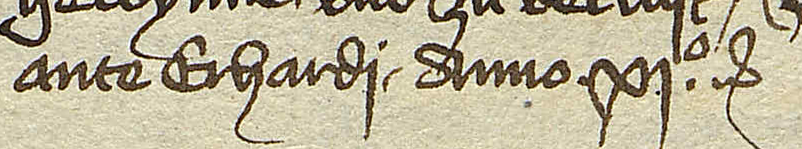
ante Erhardi / Anno . xi* . §
